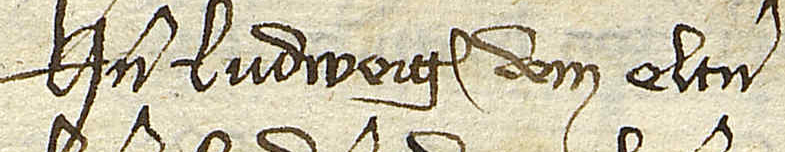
H*n ludweig* dem elt*n
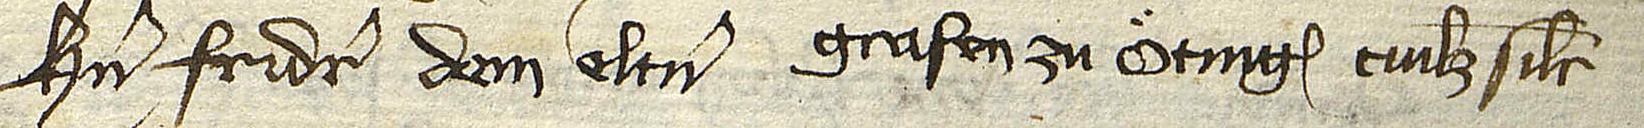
H*n Fridr* dem elt*n grafen ʒu Öting* cuil* ſilr*
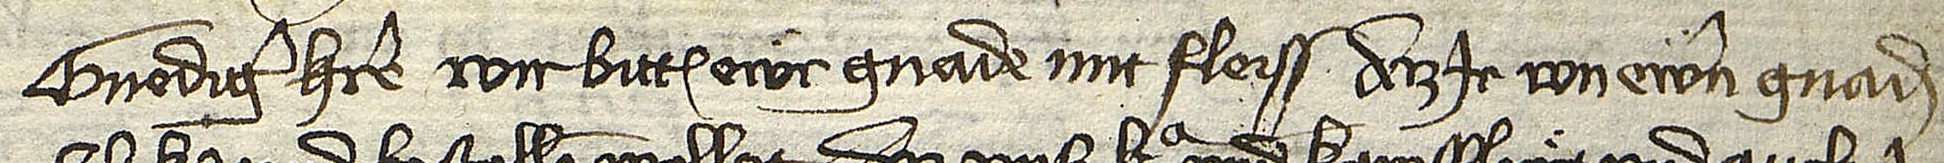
Gnedig* h*re wir bitt* ewr gnade mit fleiſſ daʒ Ir von ew*n gnad*
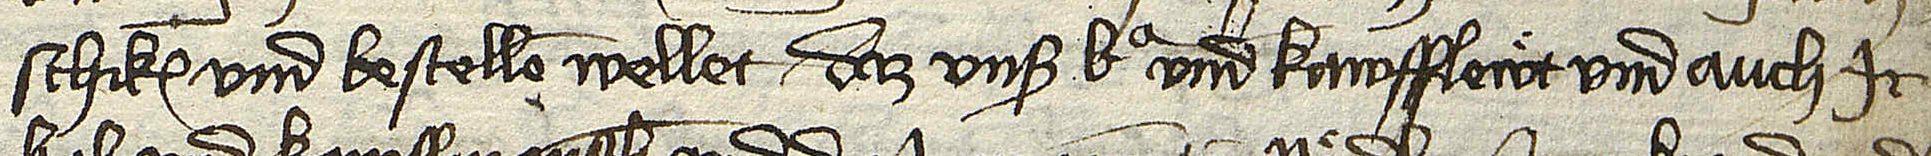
ſchik* vnd beſtelle* wellet / Daʒ vnſ* b* vnd kawfflewt vnd auch Ir
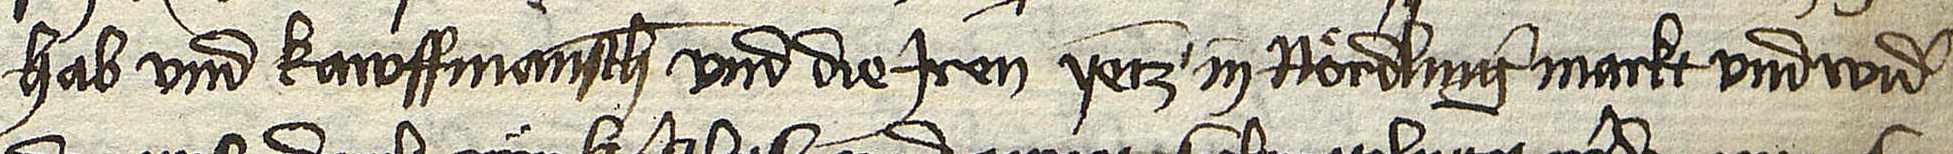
hab vnd kawffmanſch* vnd die Iren yecʒ* in Nördling* markt vnd wid*
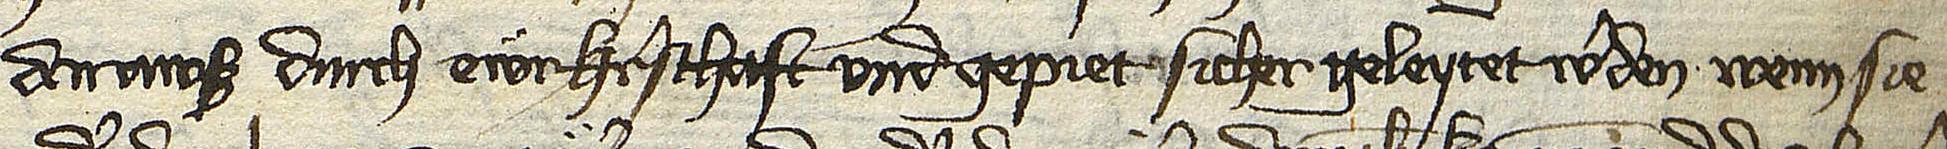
darawſʒ durch ewr h*rſchaft vnd gepiet ſicher geleytet w*den . wenn ſie
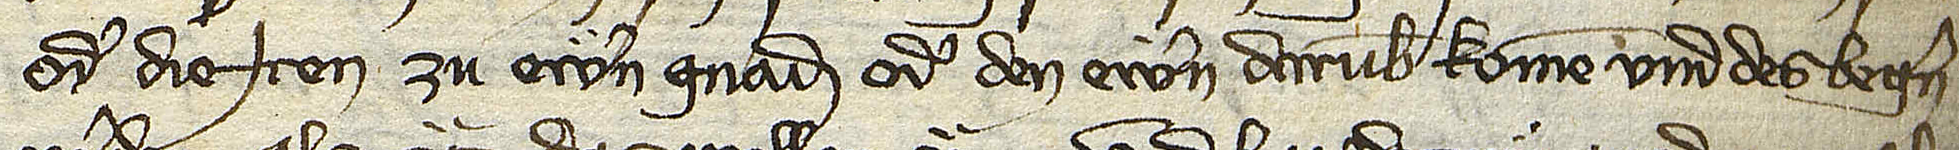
od* die Iren ʒu ew*n gnad* od* den ew*n daru*b kome* vnd des beg*n
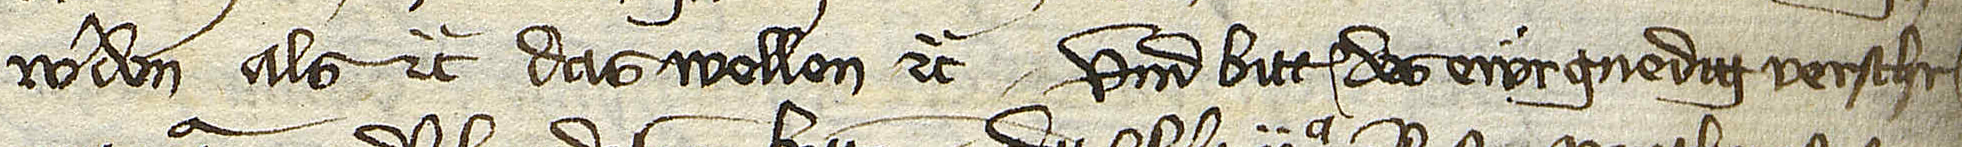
w*den als ec* das wellen ec* / Vnd bitt* des ewr gnedig verſchr*
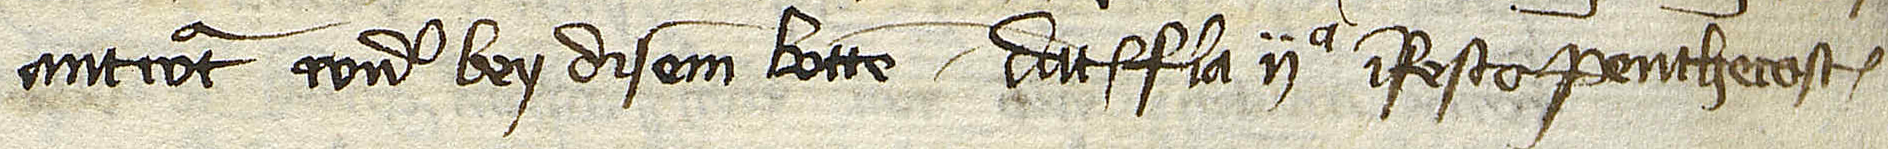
antw*t wid* bey diſem botte* / dat* f*ia ii* i* festo Penthecoſt*
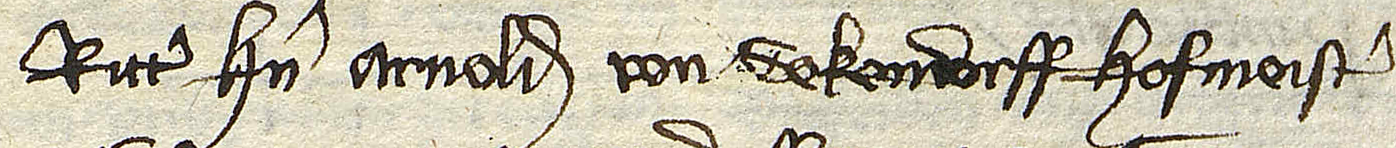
Ritt* hn* arnold* von Sekendorff hofmeiſt*
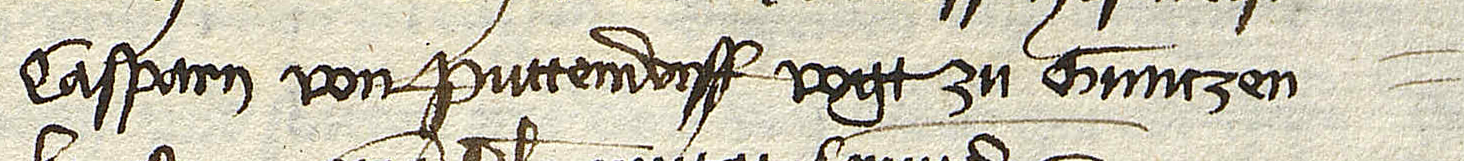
Caſparn von Puttendorff vogt ʒu Guncʒen =
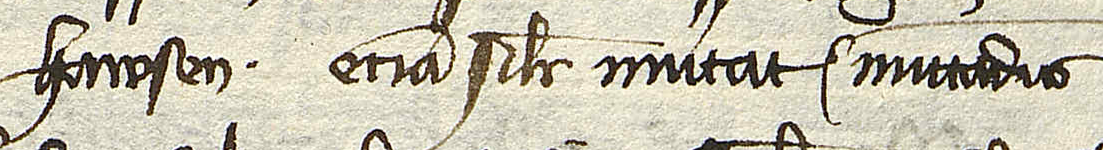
hawſen . ecia* ſilr* mutat* mutadis*
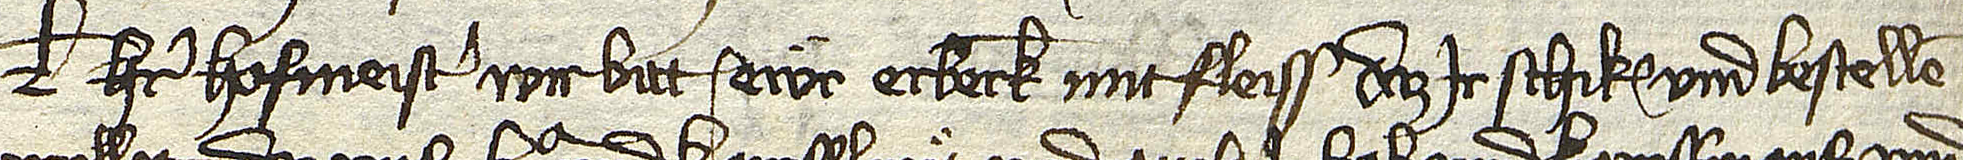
L* hr* hofmeiſt* wir bitt* ewr erberk* mit fleiſſ daʒ Ir ſchik* vnd beſtelle*
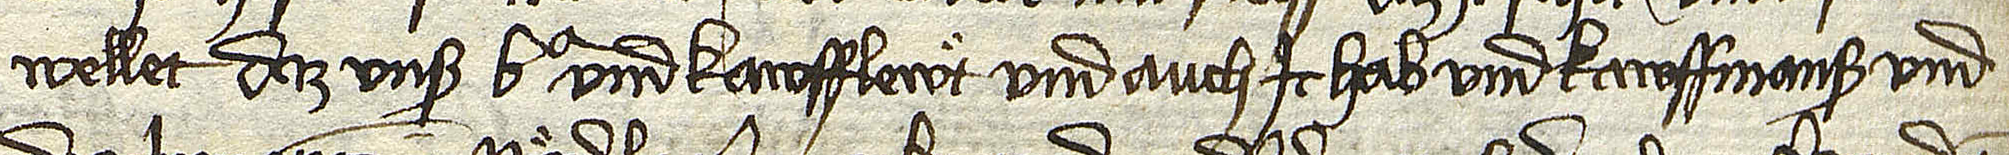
wellet daʒ vnſ* b* vnd kawfflewt vnd auch Ir hab vnd kawffmanſ* vnd
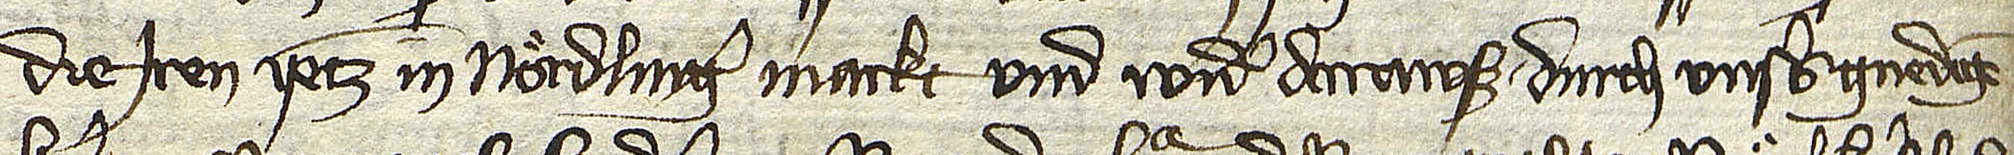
die Iren yecʒ* in Nördling* markt vnd wid* darawſʒ / durch vnſ*s gnedige*
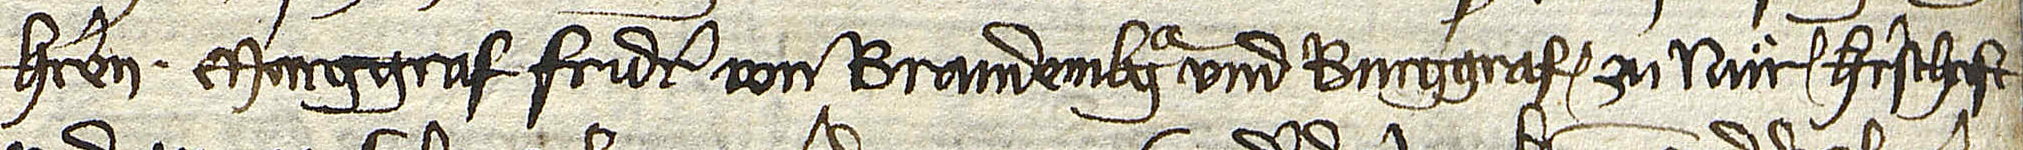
h*ren . Marggraf fridr* von Brandemb*g vnd Burggraf* ʒu Nür* h*rſchaft
